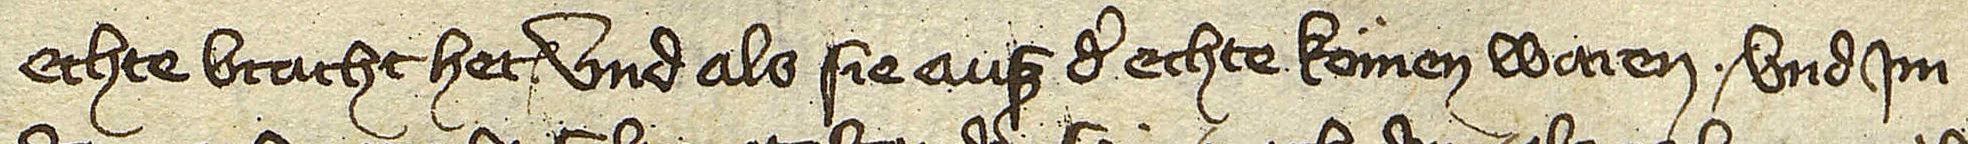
echte bracht her / Vnd als ſie auſʒ d* echte kömen waren . / vnd Im
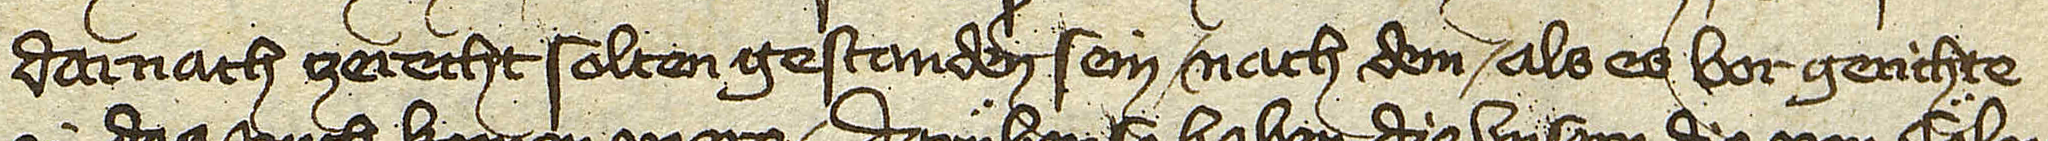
darnach cʒerecht ſolten geſtanden ſein / nach dem / als es vor gerichte
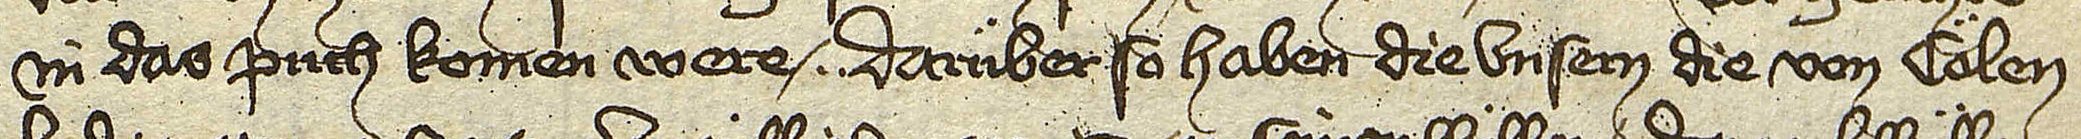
in das puch komen were / ~ Darüber ſo haben die vnſern die von Cölen
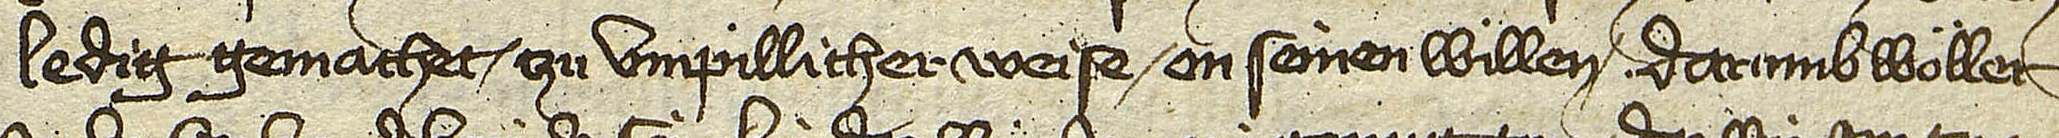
ledig gemachet / cʒu vmpillicher weiſe / on ſeinen willen / darumb wöllet
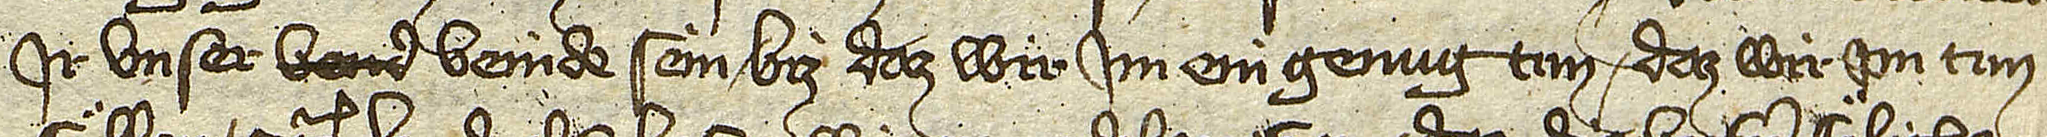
Ir vnſer vend veinde ſein / biʒ daʒ wir Im ein genug tun / daʒ wir Im tun
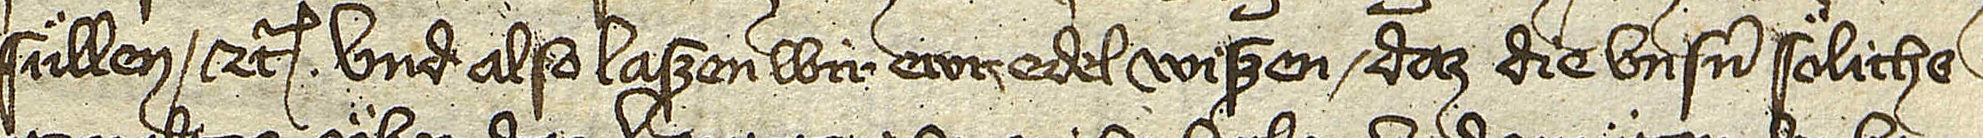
ſüllen / ec* . vnd alſo laſʒen wir ewr edel wiſʒen / daʒ die vnſn* ſölichs
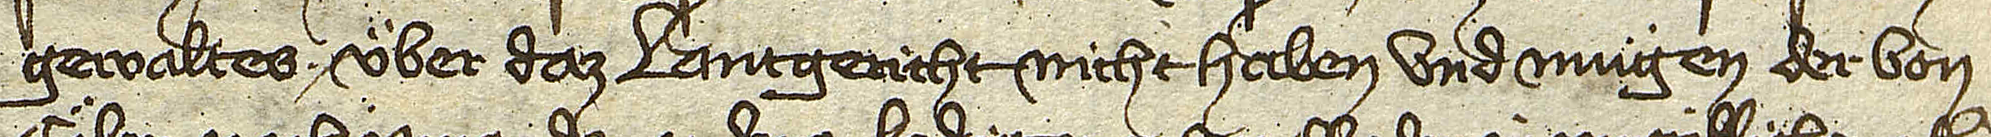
gewaltes v̈ber daʒ Lantgericht nicht haben vnd mügen der von
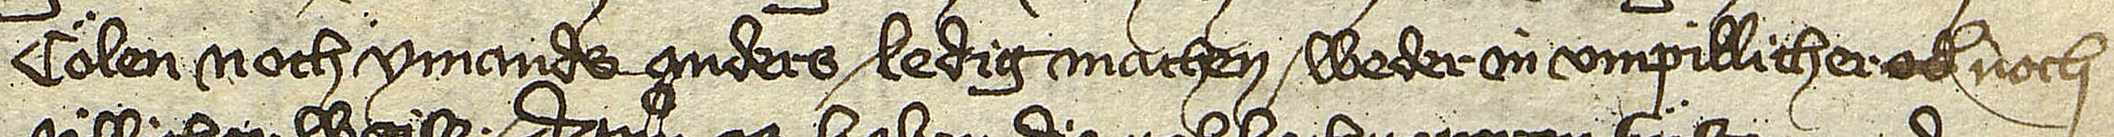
Cölen noch yemands anders / ledig machen / weder in vmpillicher od* noch
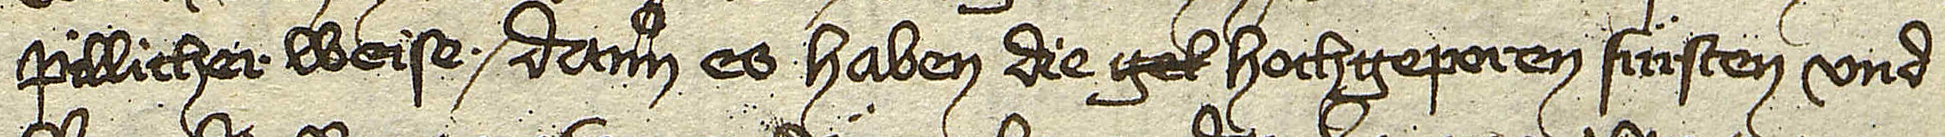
pillicher weiſe . / dann es haben die gel hochgeporen fürſten vnd
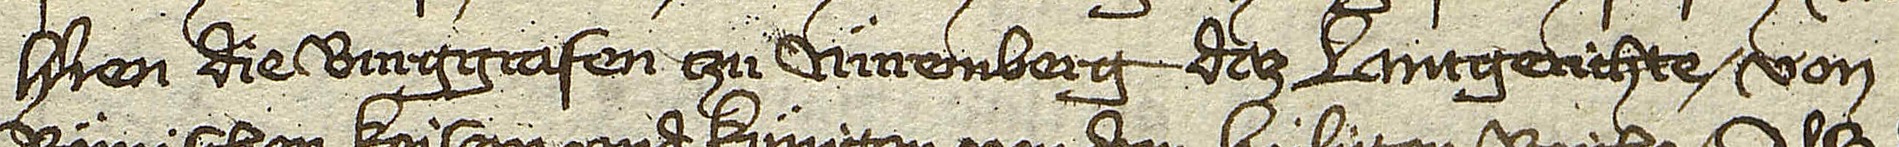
h*ren die Burggrafen cʒu Nüremberg daʒ Lantgerichte / von
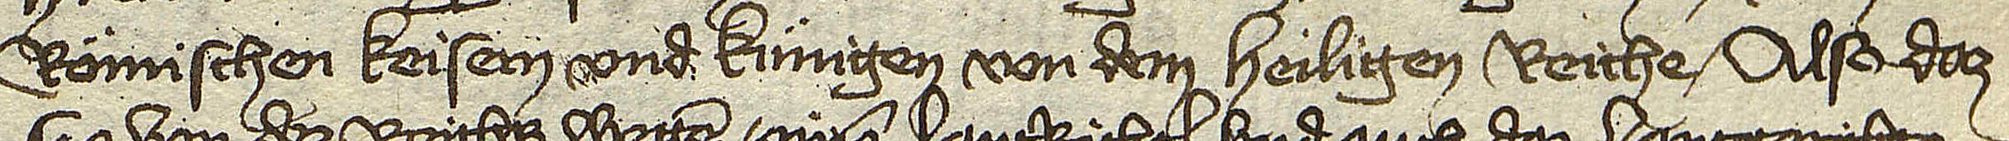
Römiſchen keiſern vnd künigen von dem Heiligen Reiche / Alſo daʒ
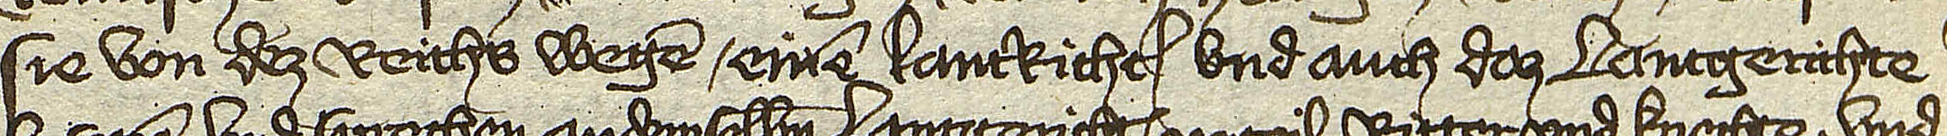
ſie von deʒ Reichs wege* / eine* lant*Richt* vnd auch daʒ Lantgerichte
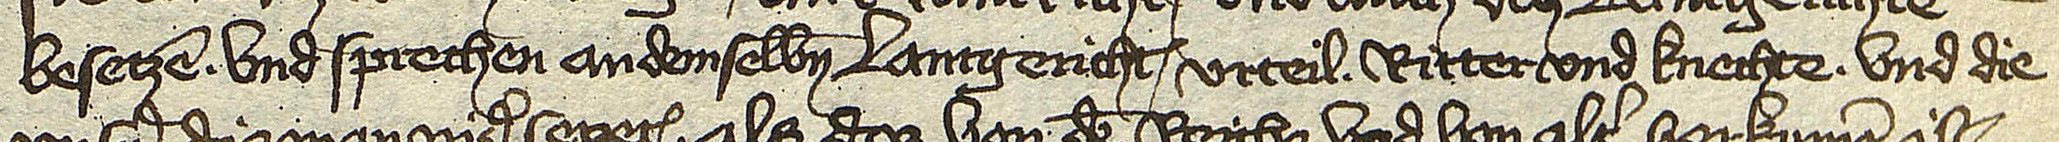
beſecʒe* . vnd ſprechen an demſelbn* Lantgericht* vrteil . Ritter vnd knechte . vnd die
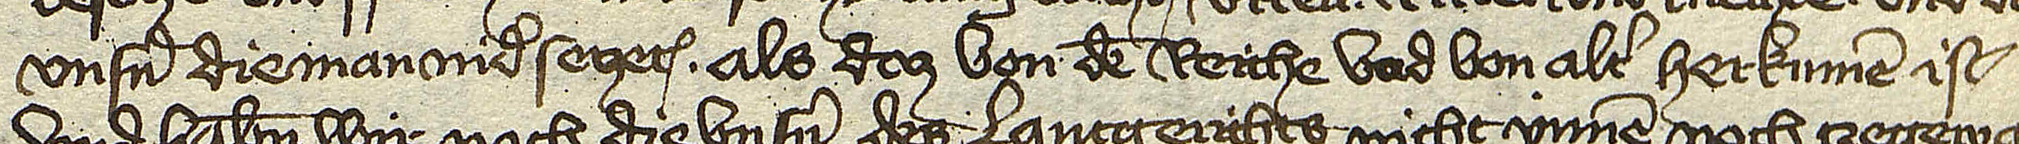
vnſn* die man nid* ſecʒet* . als daʒ von de* Reiche vnd von alt* herkume* iſt /
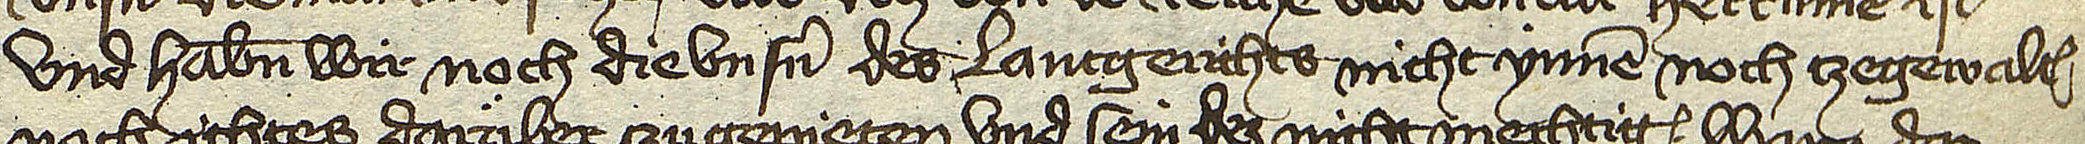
vnd habn* wir noch die vnſn* des Lantgerichts nicht ynne* noch cʒegewalt*
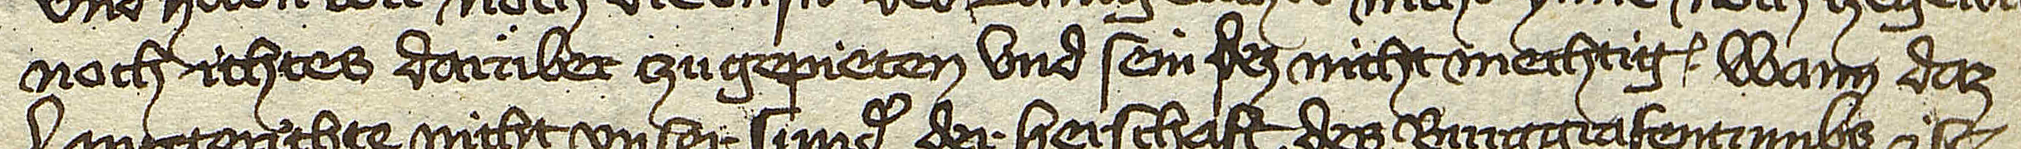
noch ichtes darüber cʒu gepieten vnd ſein deʒ nicht mechtig / wann daʒ
